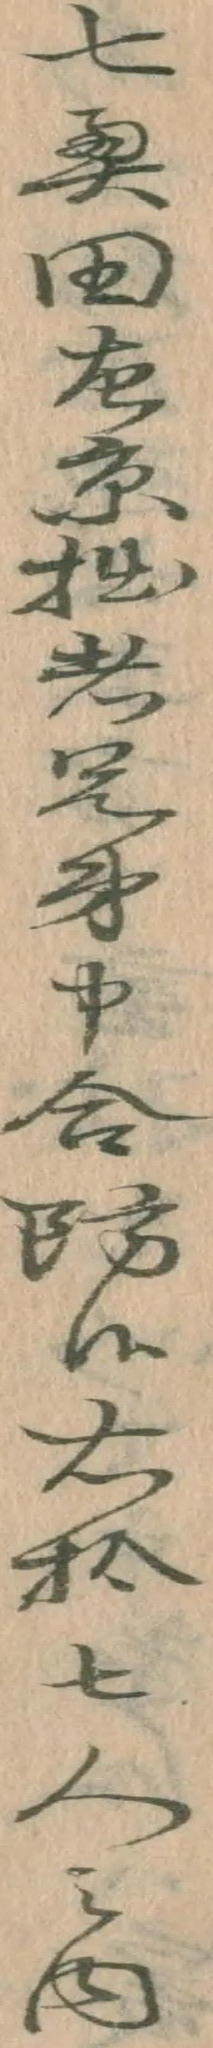七奥田左京拙者兄弟申合防候右拾七人之内
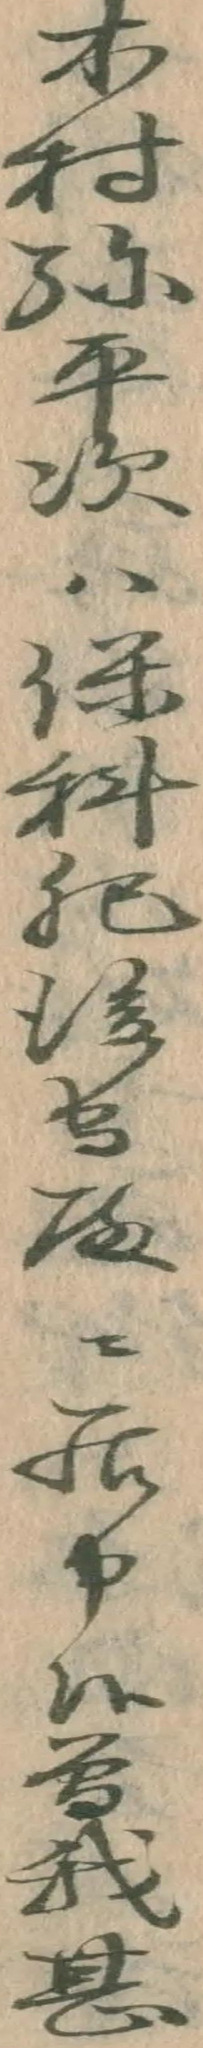木村弥平次は保科肥後守殿に居申候曽我甚
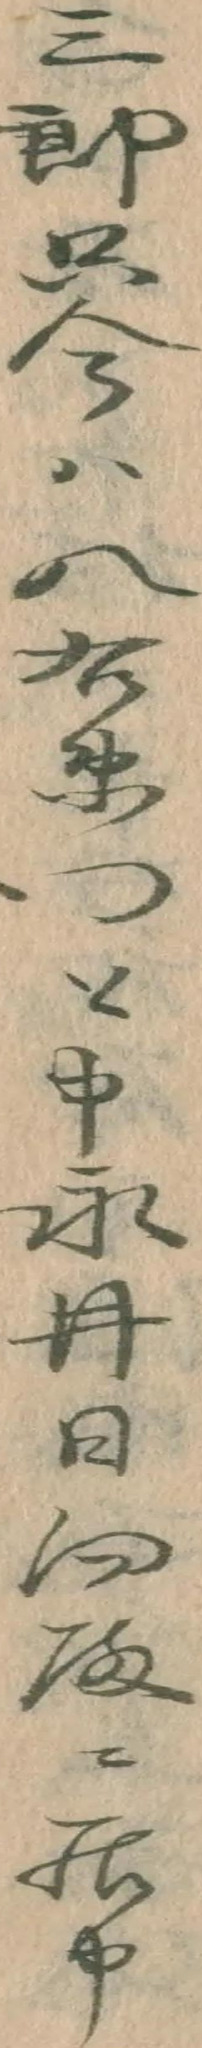三郎只今は八右衛門と申永井日向殿に居申
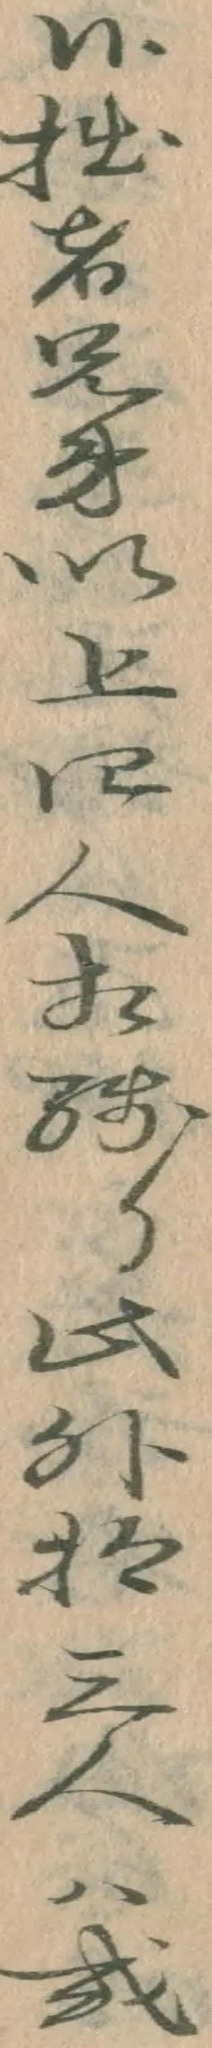候拙者兄弟以上四人相残り此外於三人は或
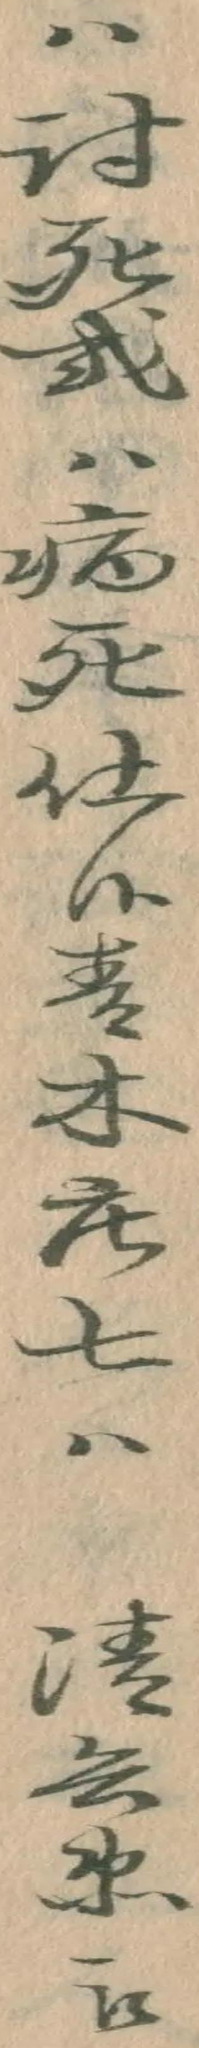は討死或は病死仕候青木庄七は清兵衛被
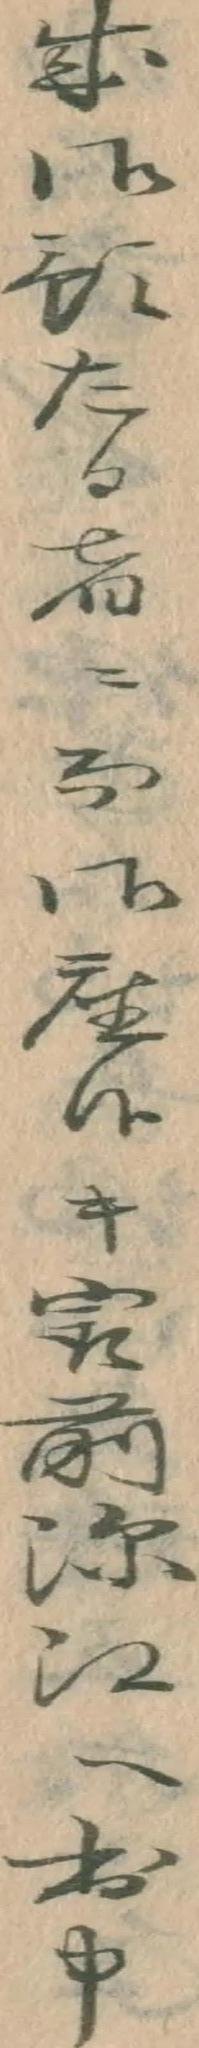成御預たる者に而御座候キ最前深江へ出申
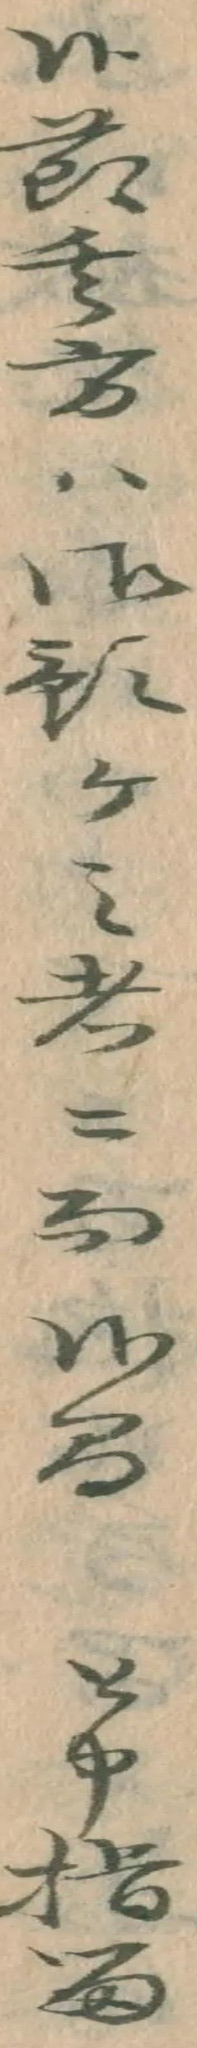候節其方は御預け之者に而候間と申指留
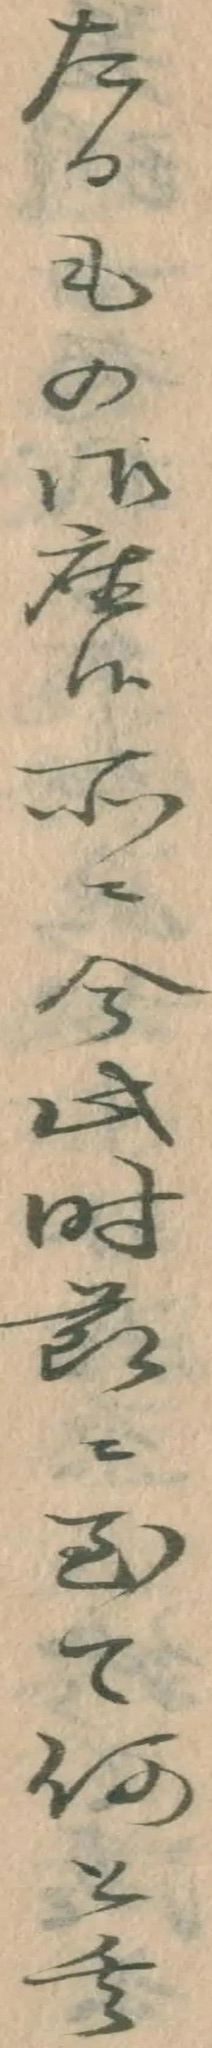たるもの御座候所に今此時節に至て何と其

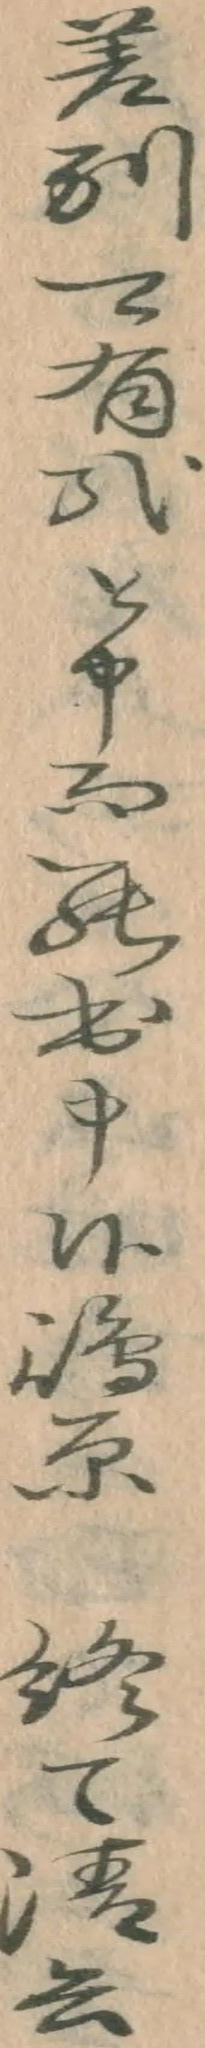差別可有哉と申而罷出申候島原終て清兵
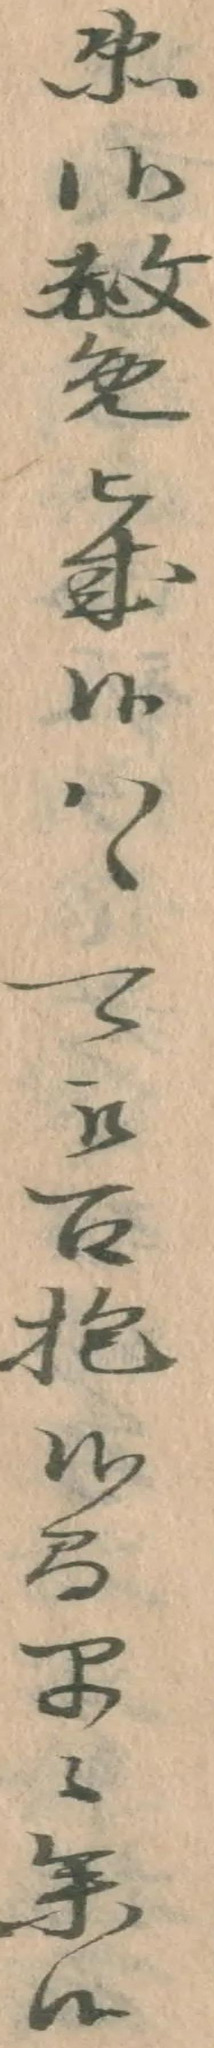衛御赦免被成候はゝ可被召抱候間早々参候
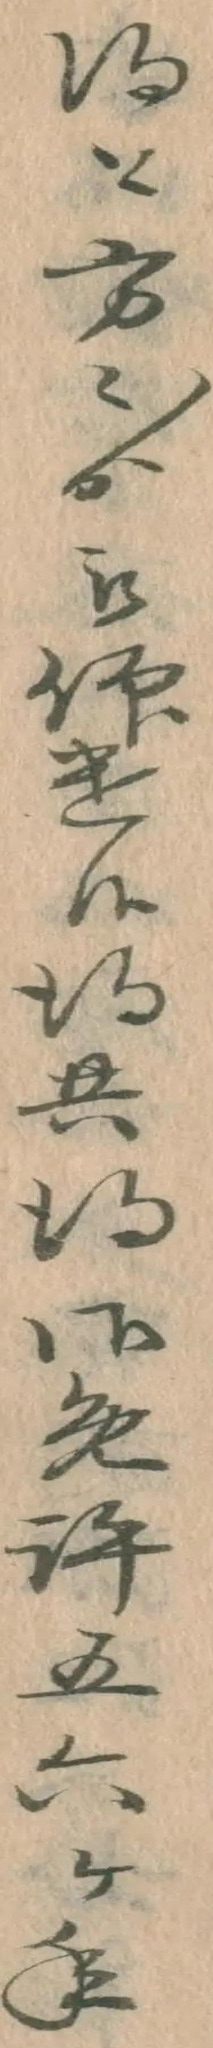得と方々ゟ被仰遣候得共得御免許五六ヶ年
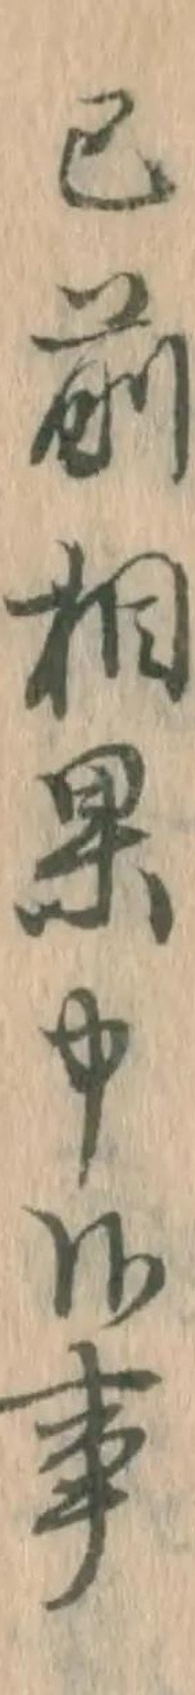已前相果申候事
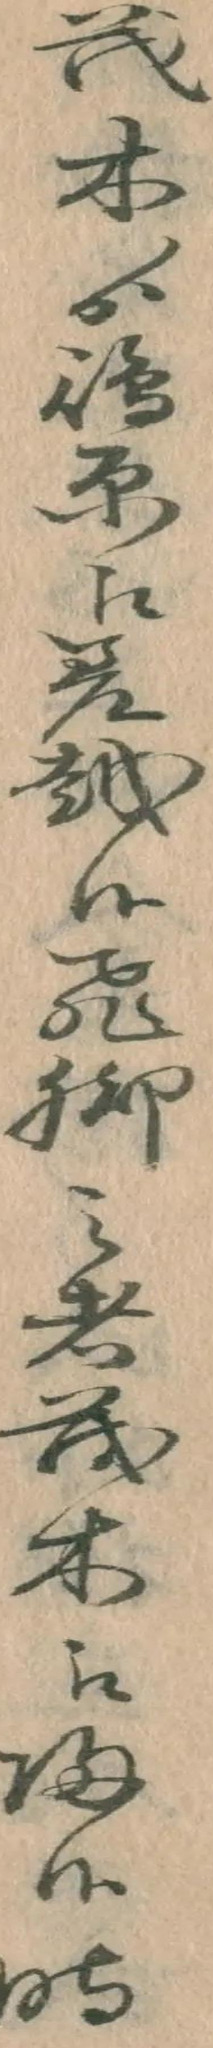茂木ゟ島原え差越候飛脚之者茂木え帰候時
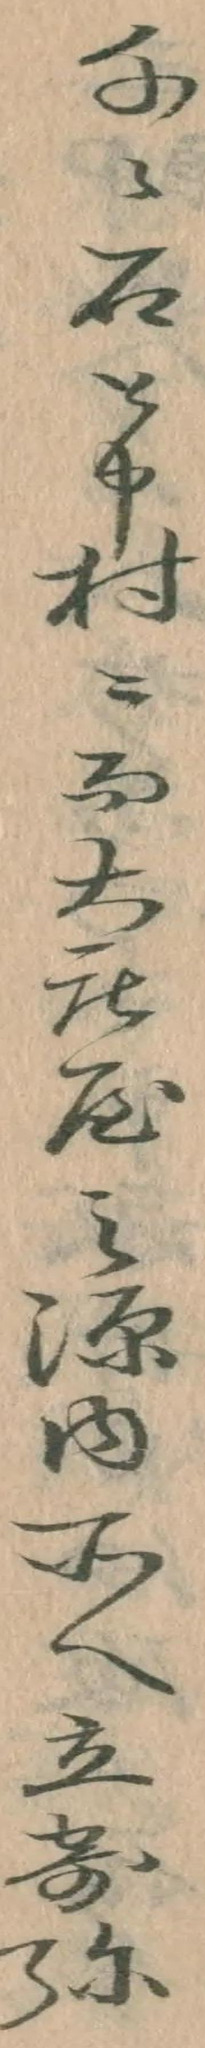千々石と申村に而大庄屋之源内所へ立寄弥
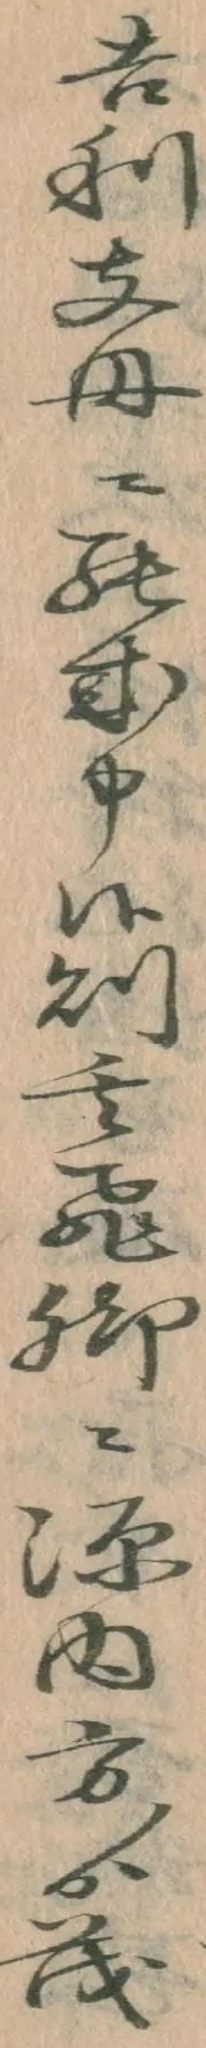吉利支丹に罷成申候則其飛脚に源内方ゟ茂
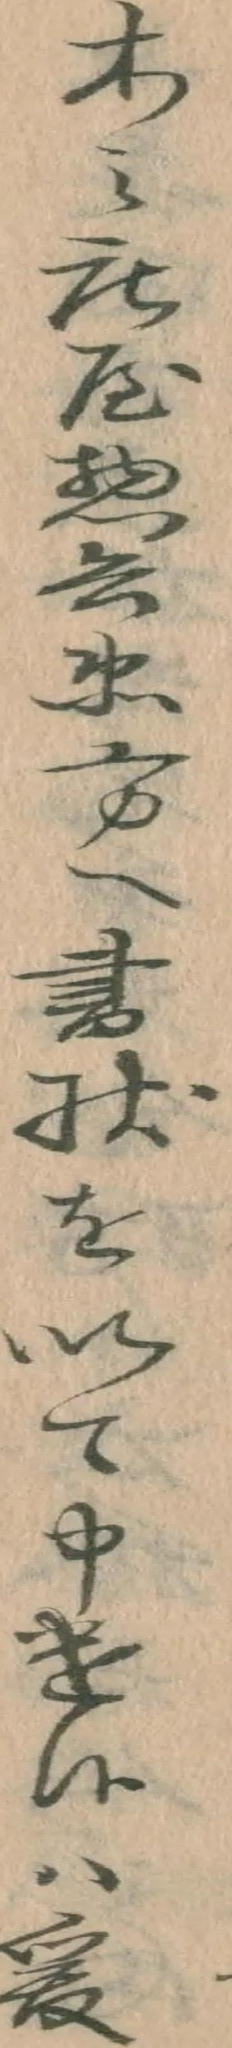木之庄屋惣兵衛方へ書状を以て申遣候は爰
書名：切支丹御退治記 49巻. [1]
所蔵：国立国会図書館 National Diet Library, JAPAN
